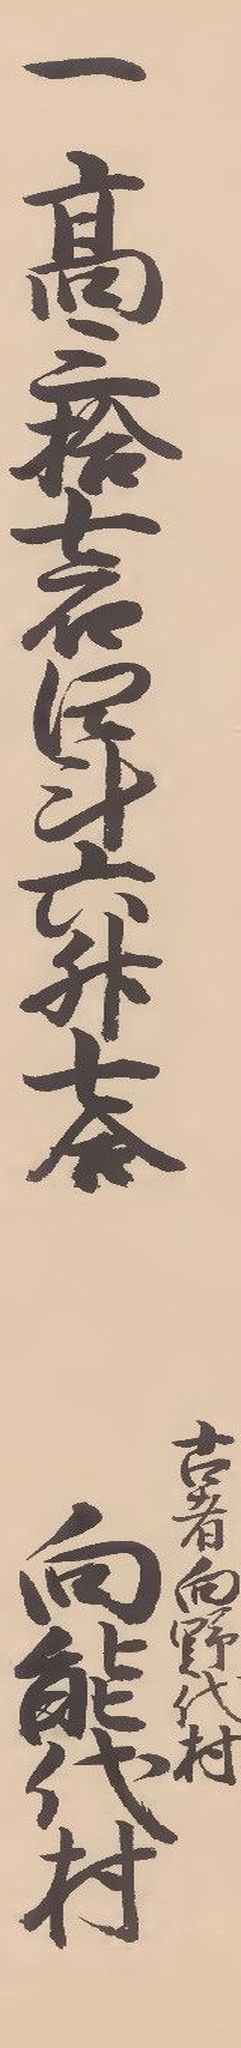一高三拾七石四斗六升七合向能代村
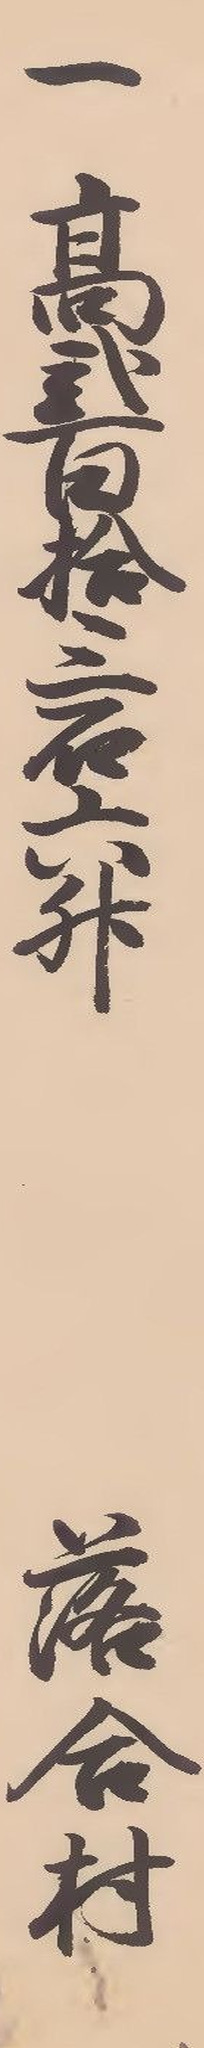一高弐百拾三石六升落合村
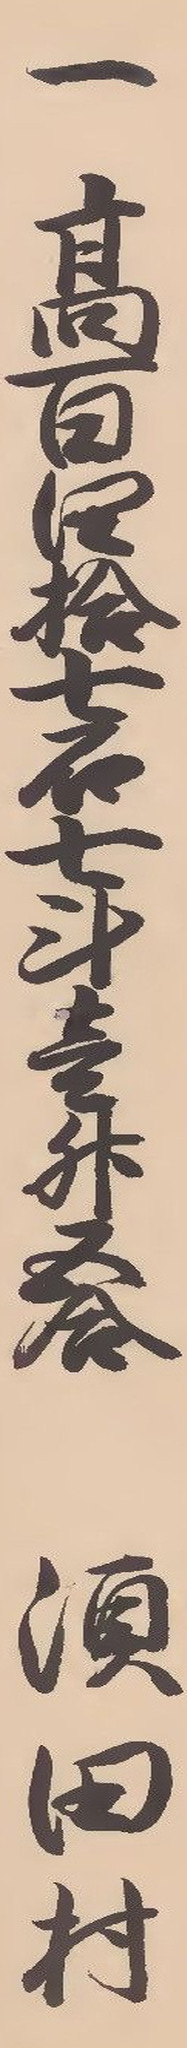一高百四拾七石七斗壱升五合須田村
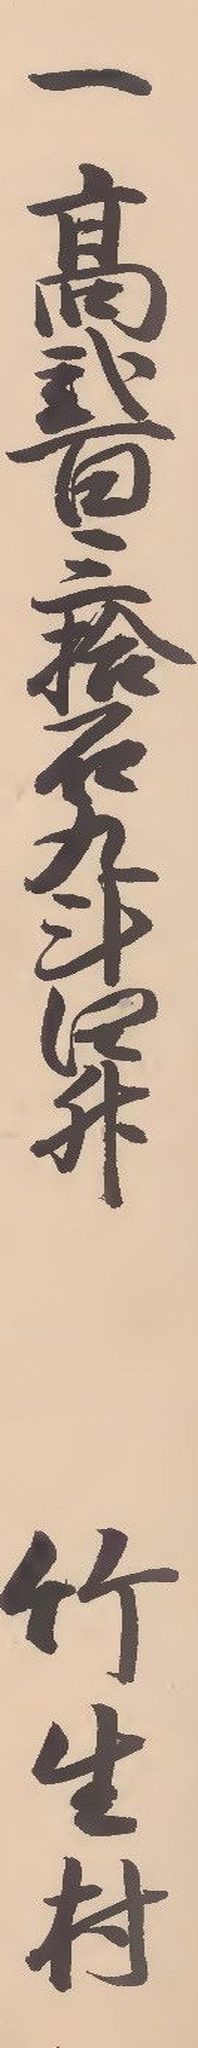一高弐百三拾石九斗四升竹生村
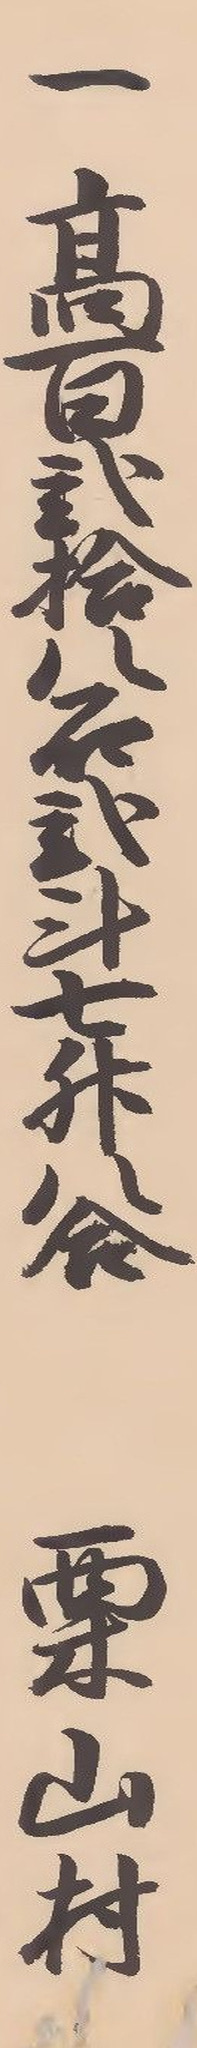一高百弐拾八石弐斗七升八合栗山村
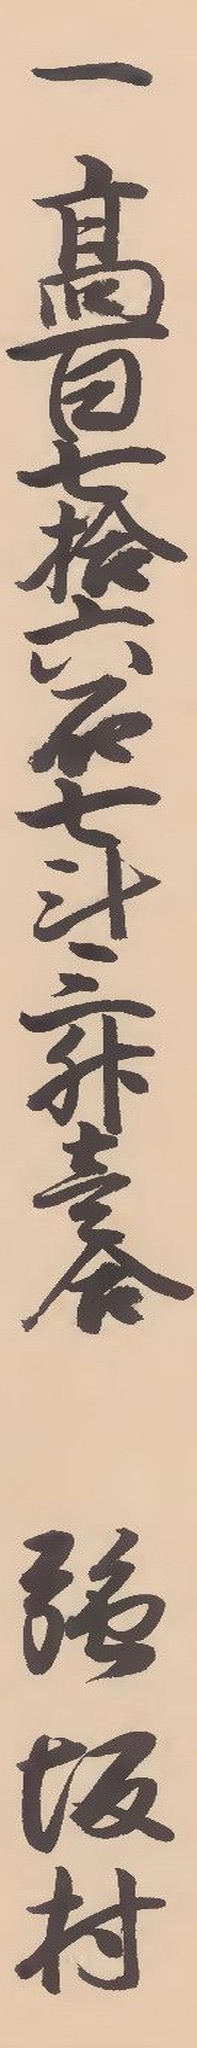一高百七拾六石七斗三升壱合強坂村

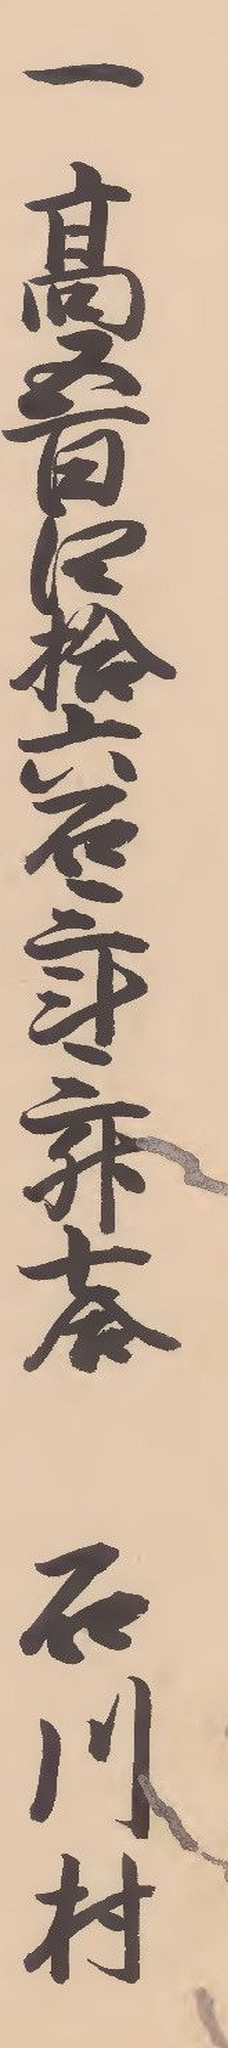一高五百四拾六石三斗三升七合石川村
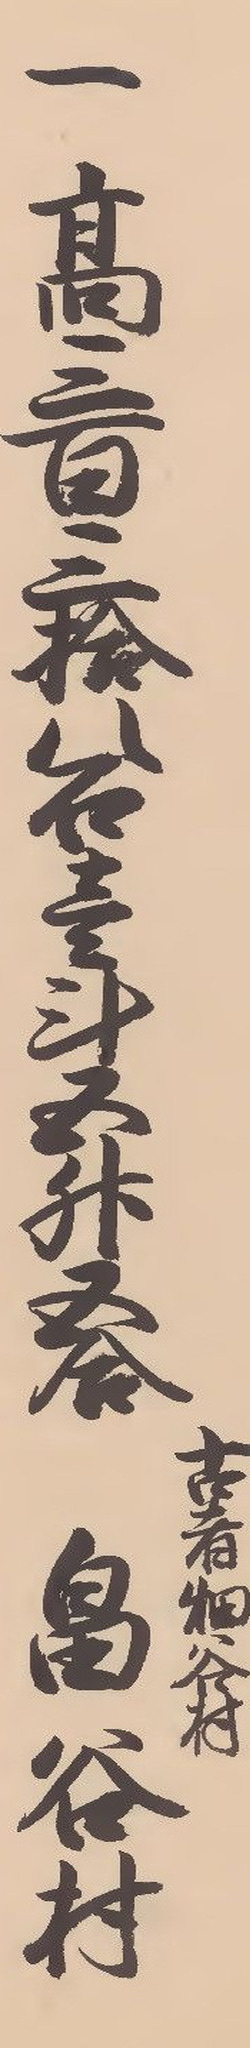一高三百三拾八石壱斗五升五合畠谷村
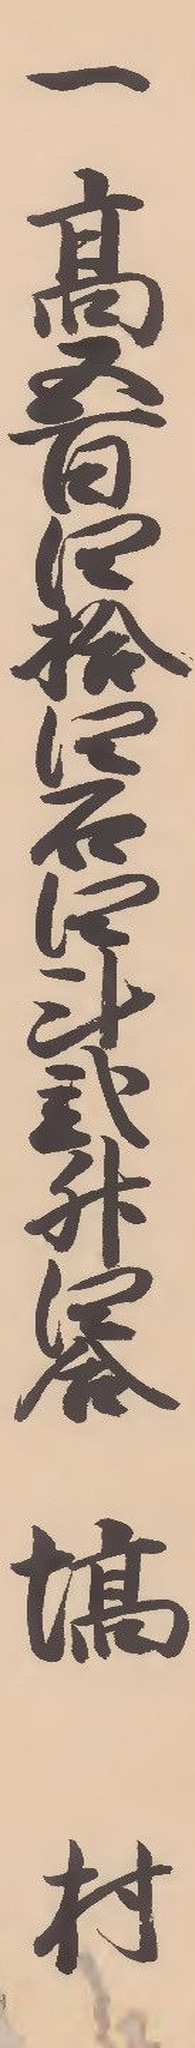一高五百四拾四石四斗弐升四合塙村
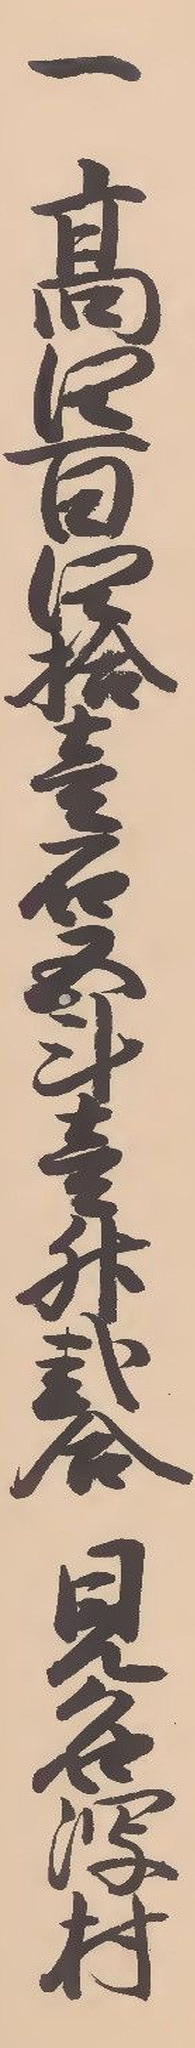一高四百四拾壱石五斗壱升弐合見名潟村
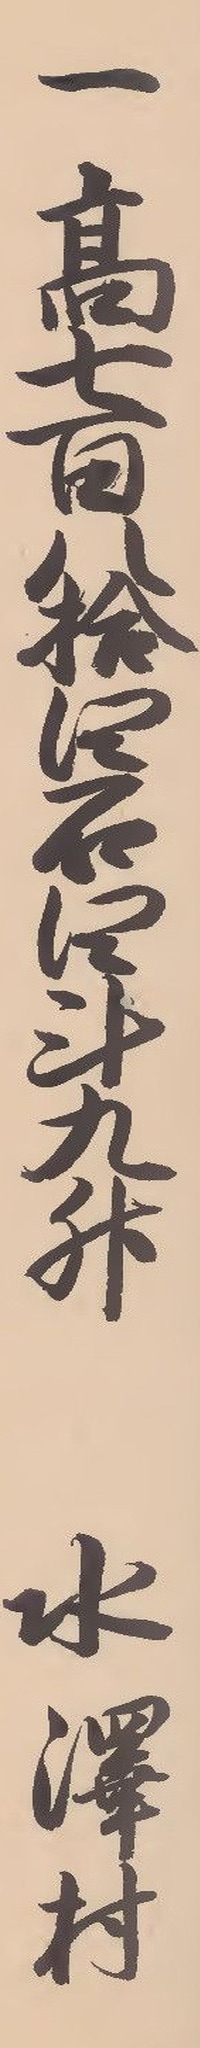一高七百八拾四石四斗九升水沢村
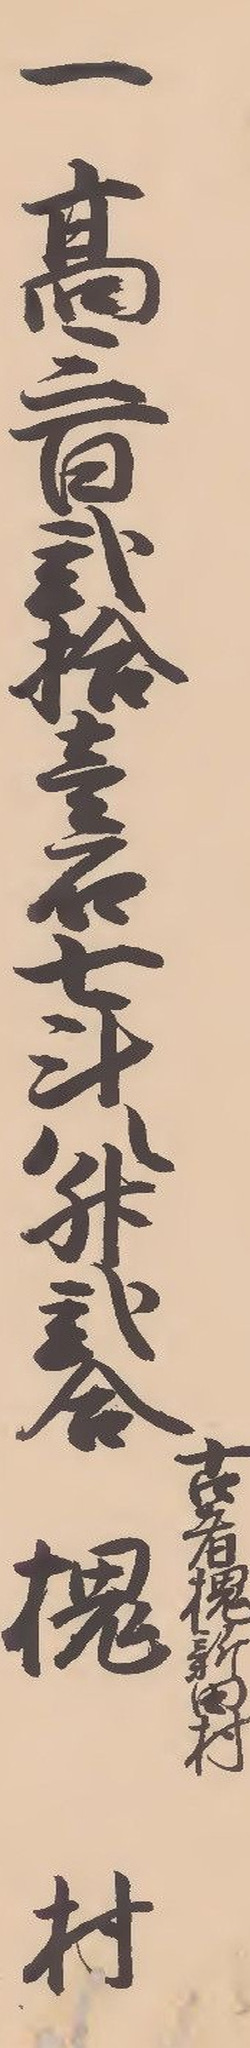一高三百弐拾壱石七斗八升弐合槐村
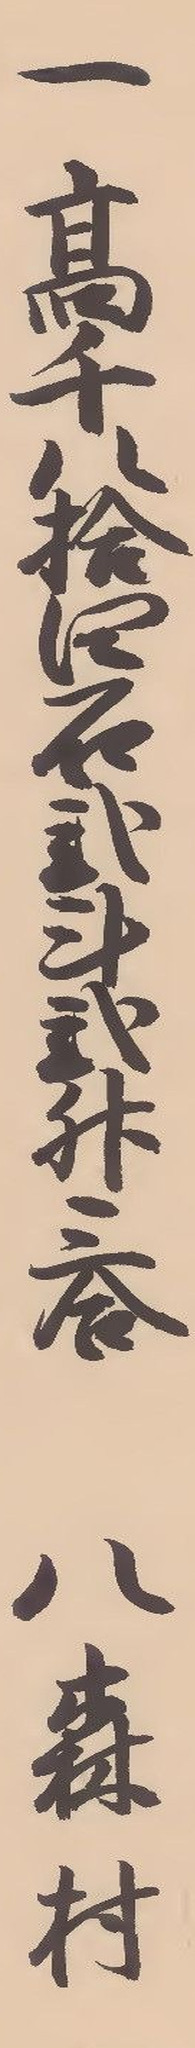一高千八拾四石弐斗弐升三合八森村
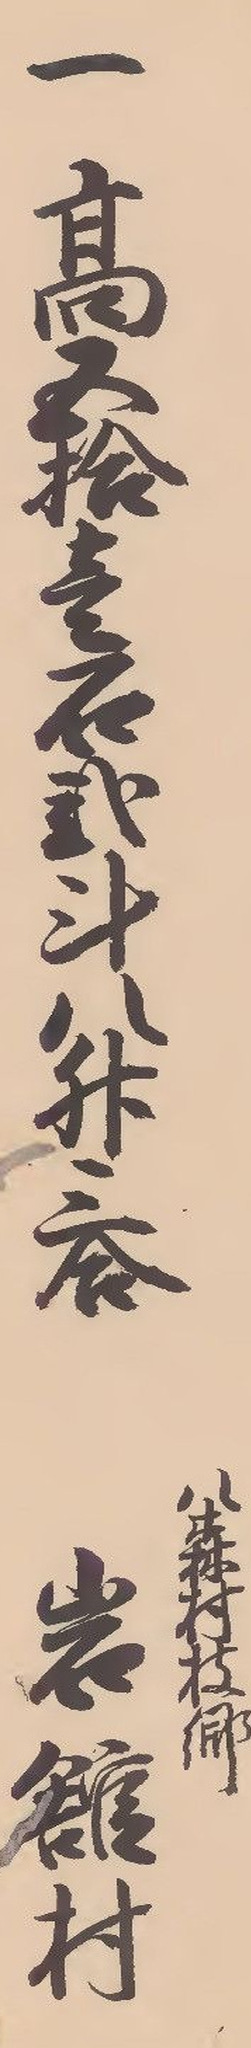一高五拾壱石弐斗八升三合岩館村

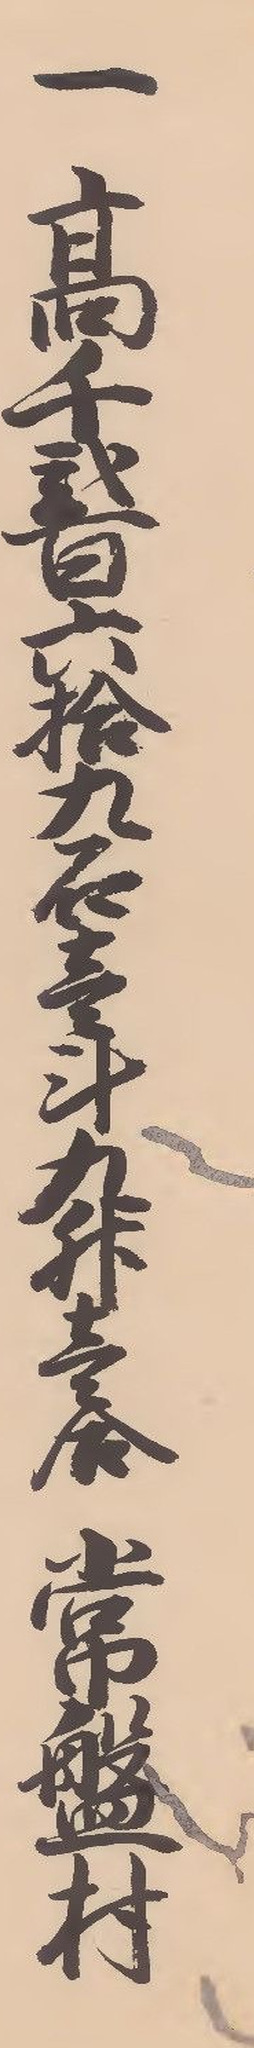一高千弐百六拾九石壱斗九升壱合常盤村
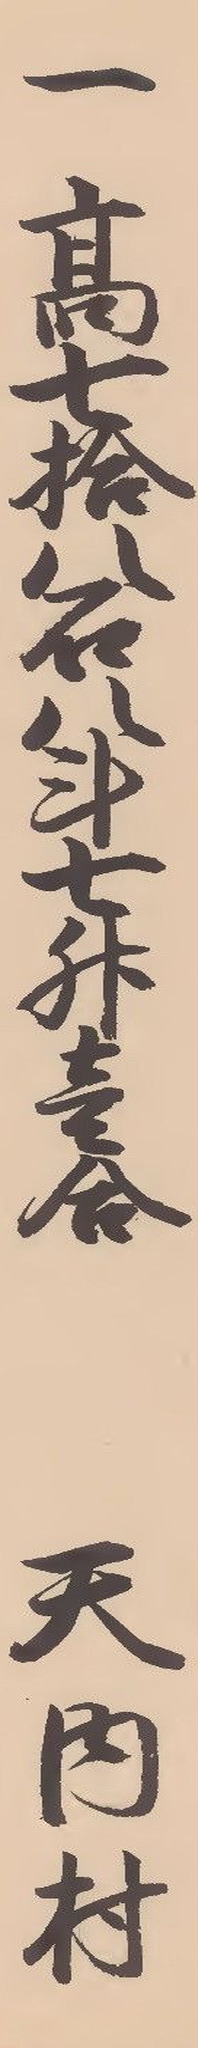一高七拾八石八斗七升壱合天内村
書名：出羽国郷帳　５
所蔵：国立公文書館 National Archives of Japan
